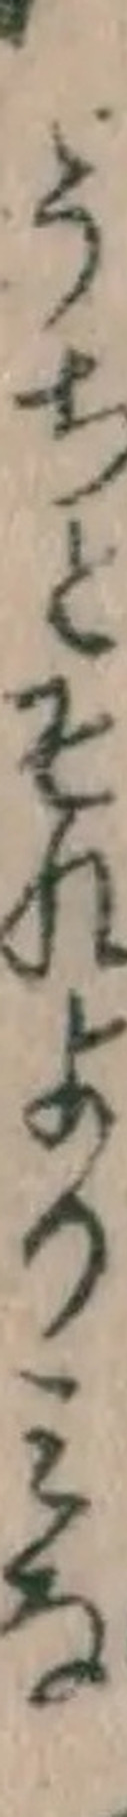うちとそれよりみな
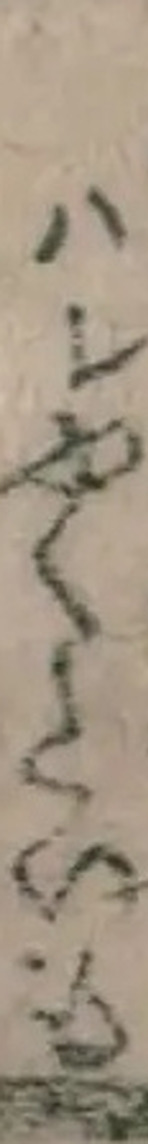ハレやくたいも
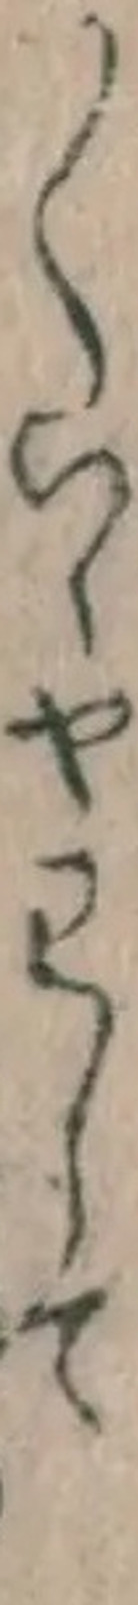〳〵いゝやわして
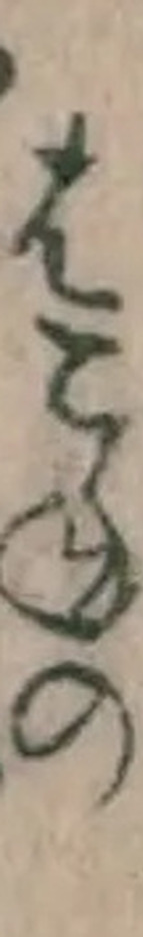はこねの
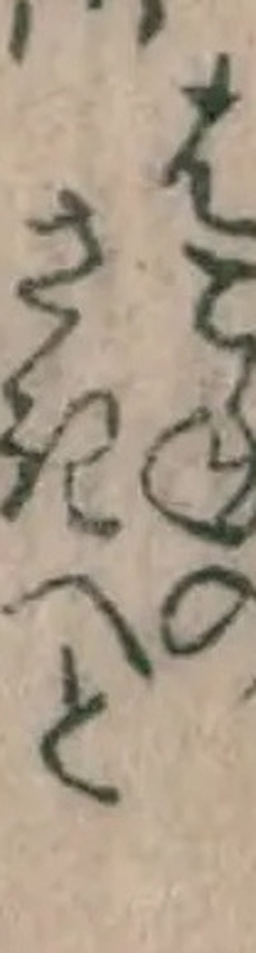さきへと
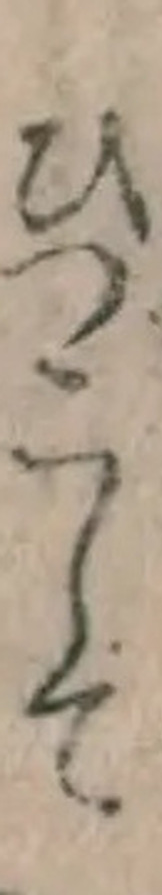ひつこして
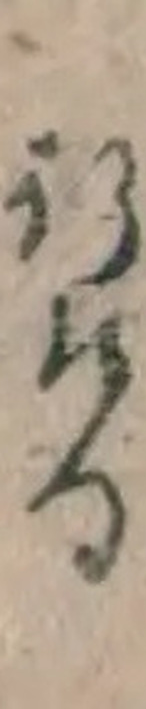行ける

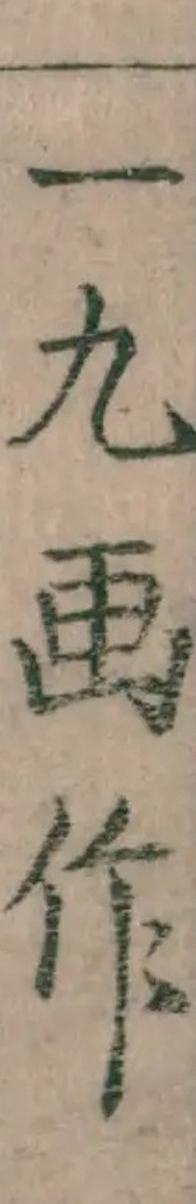一九画作
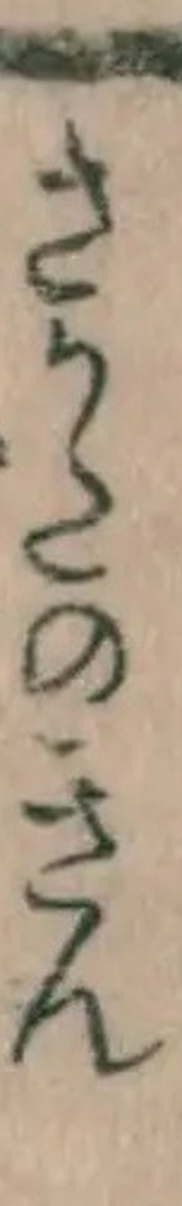さかたのきん
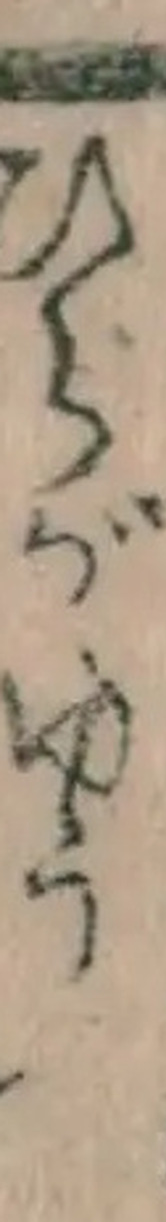ひらがゆう
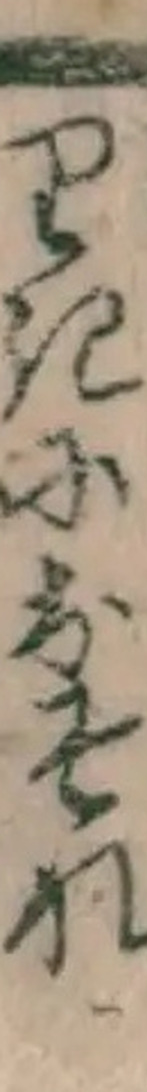りきにおそれ
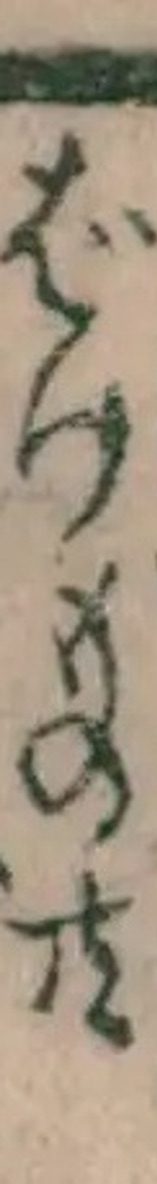ばけもの共
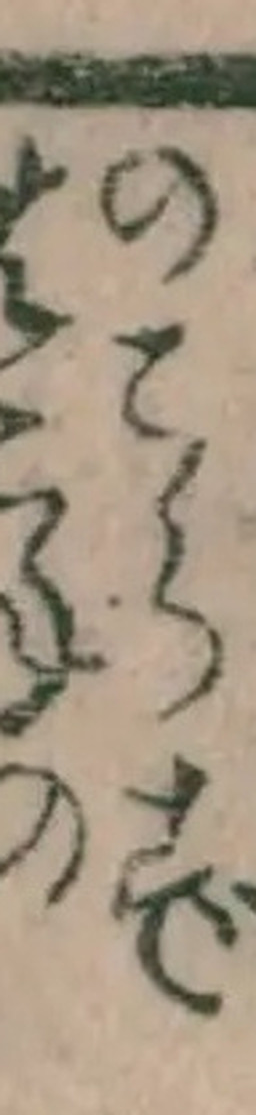はこねの
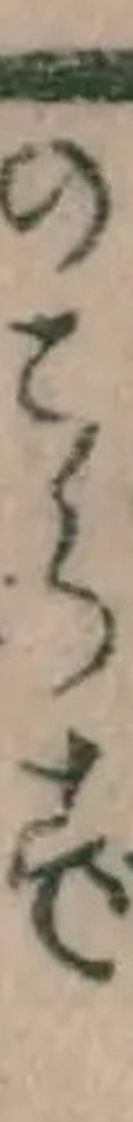のこらず
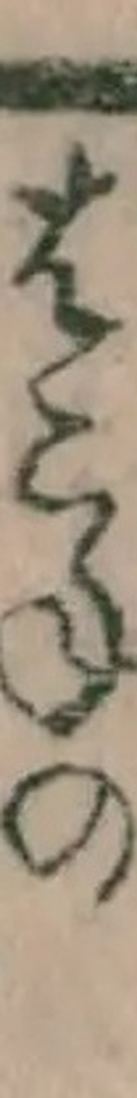はこねの
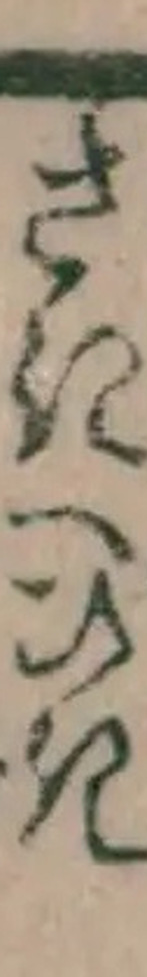さきへひき
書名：信有奇怪会
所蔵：国立国会図書館 National Diet Library, JAPAN
